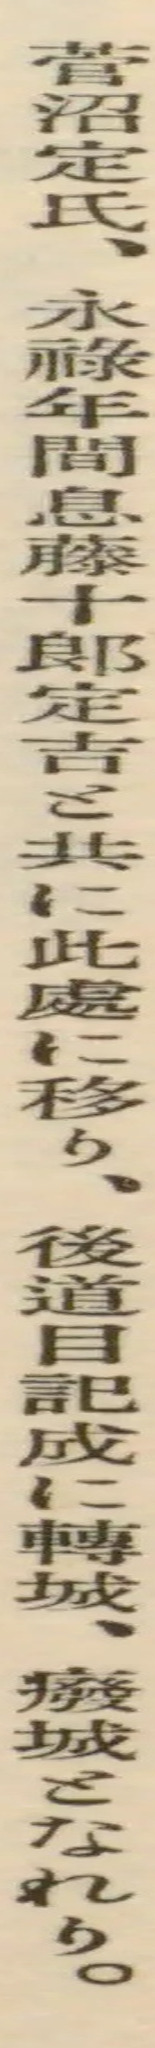菅沼定氏、永禄年間息藤十郎定吉と共に此処に移り、後道目記成に転城、廃城となれり。
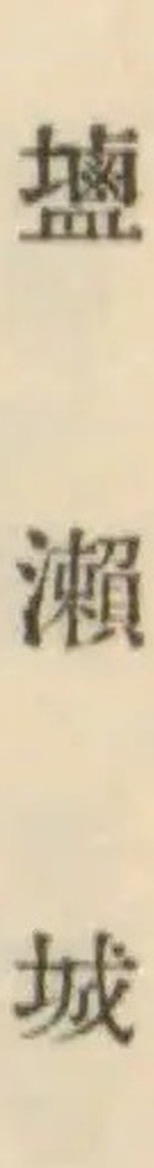塩瀬城
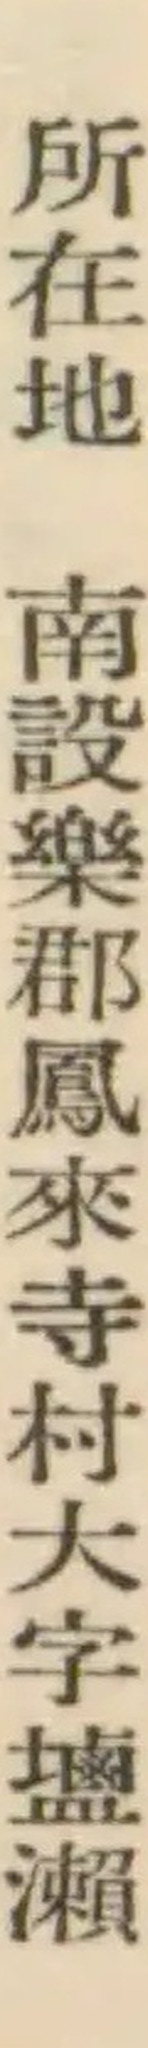所在地南設楽郡鳳来寺村大字塩瀬
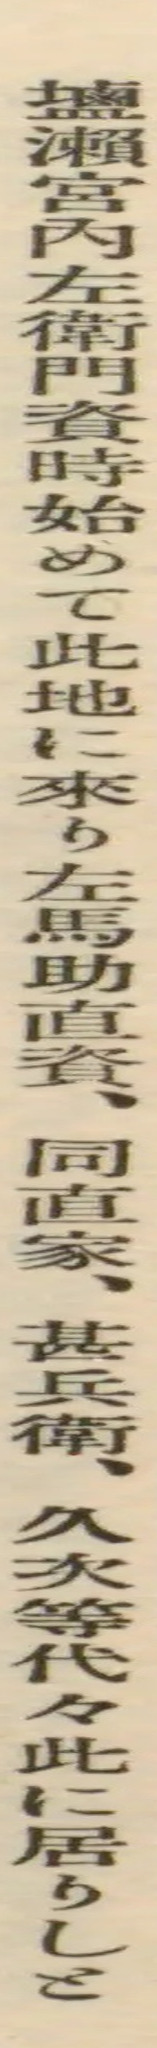塩瀬宮内左衛門資時始めて此地に来り左馬助直資、同直家、甚兵衛、久次等代々此に居りしと
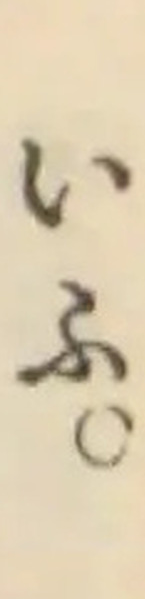いふ。
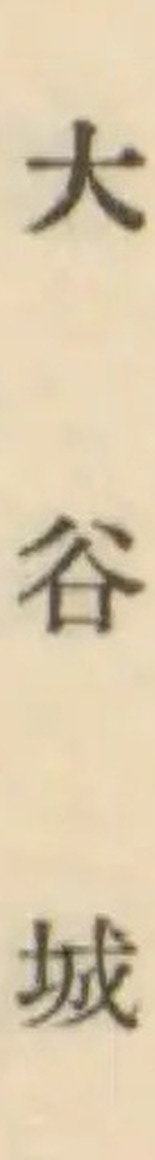大谷城
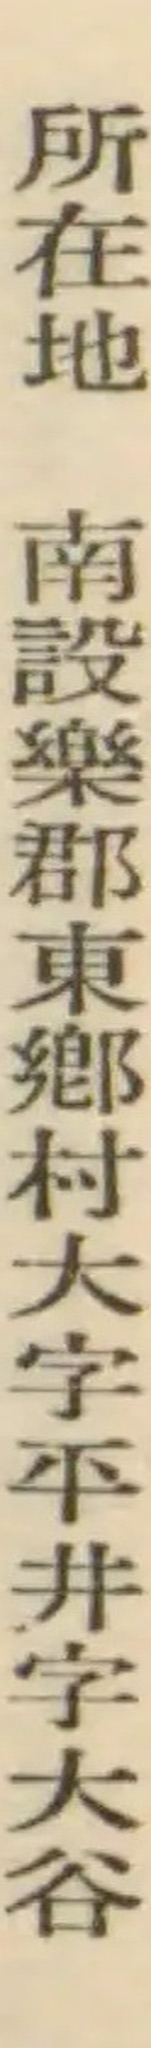所在地南設楽郡東郷村大字平井字大谷

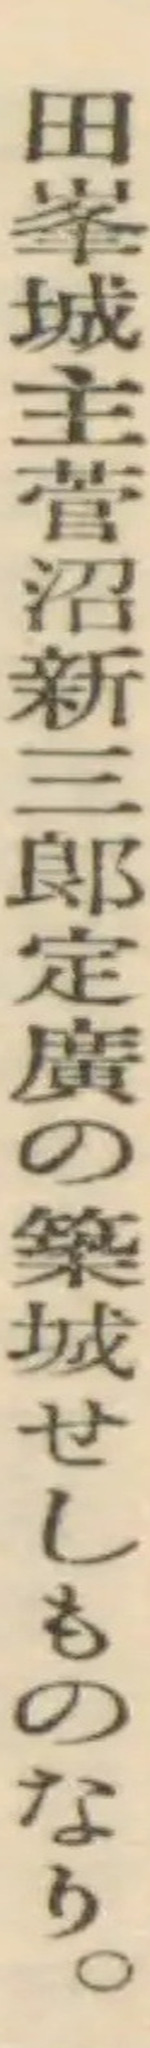田峯城主菅沼新三郎定広の築城せしものなり。
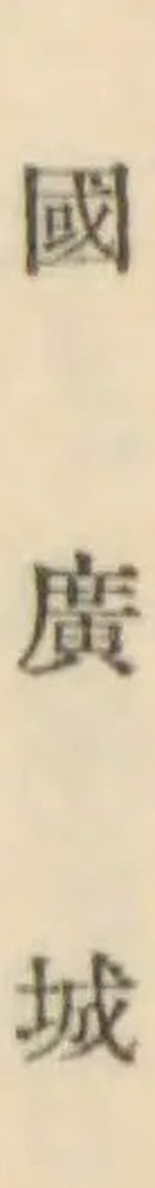国広城
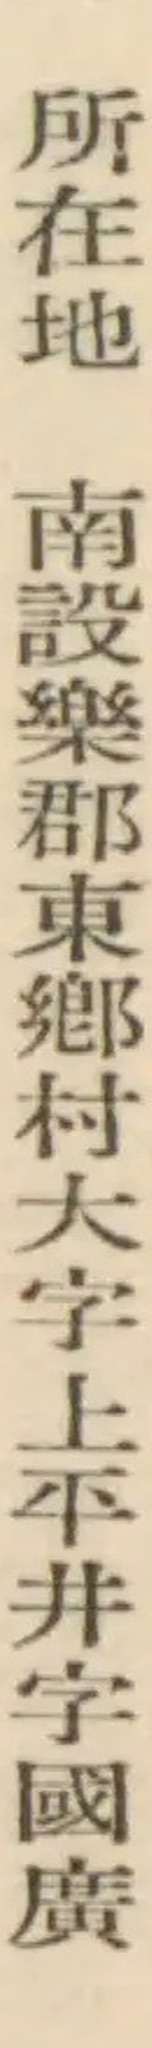所在地南設楽郡東郷村大字上平井字国広
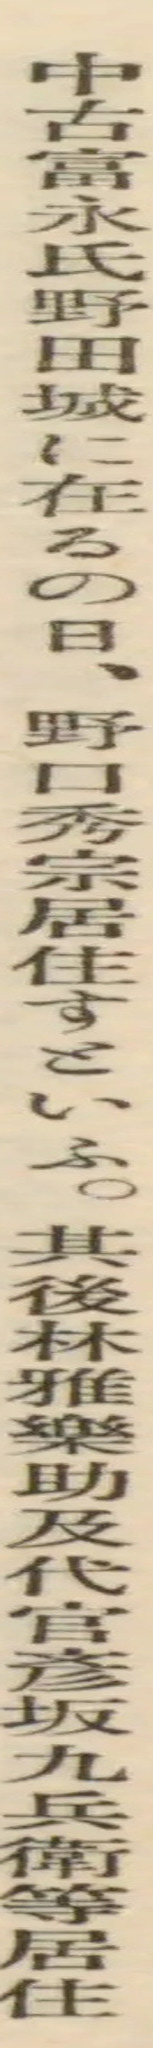中古富永氏野田城に在るの日、野口秀宗居住すといふ。其後林雅楽助及代官彦坂九兵衛等居住
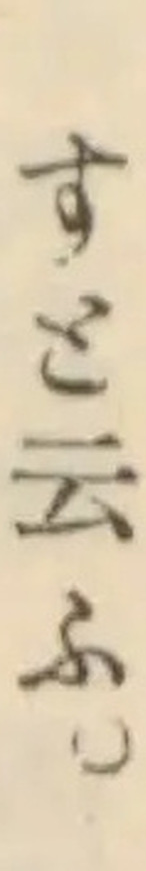すと云ふ。
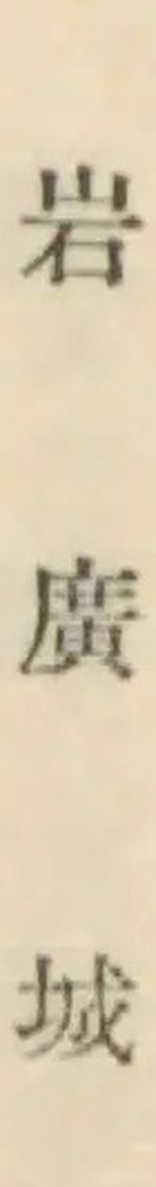岩広城
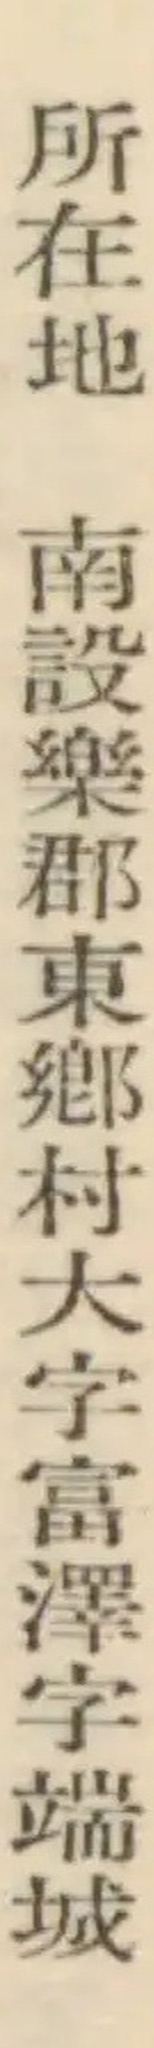所在地南設楽郡東郷村大字富沢字端城
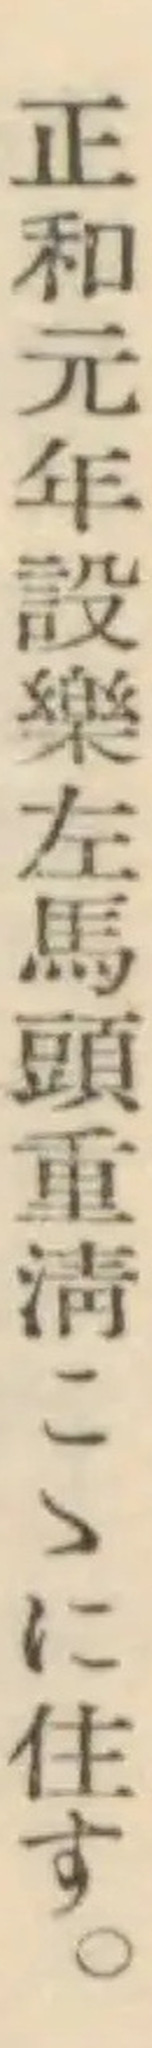正和元年設楽左馬頭重清こゝに住す。
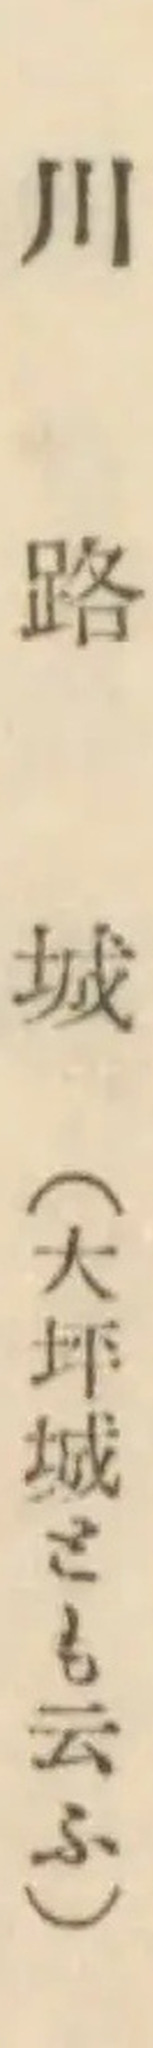川路城(大坪城とも云ふ)
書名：東三河之古城
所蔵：国立国会図書館 National Diet Library, JAPAN
